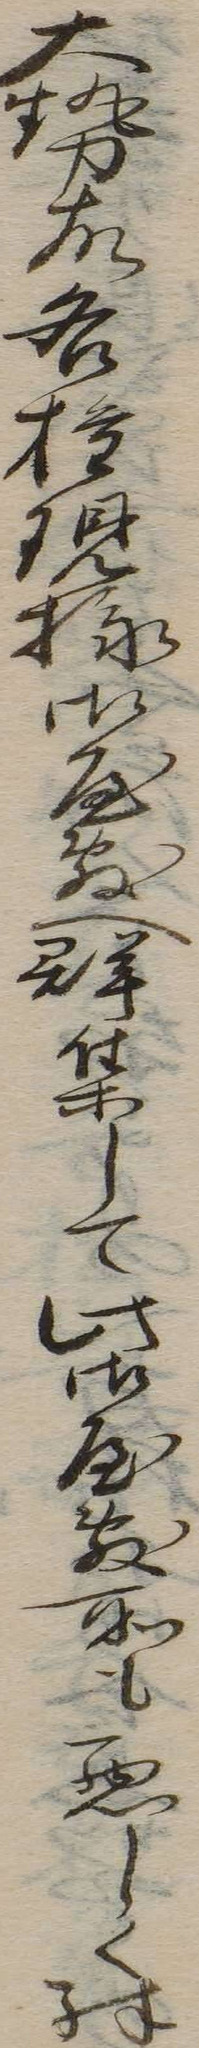大勢故各権現様御屋敷へ群集して此御屋敷所も悪しく殊
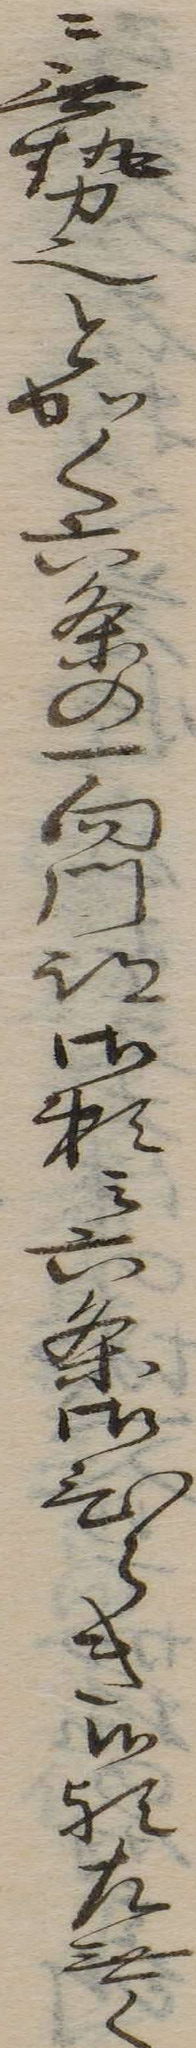ニ無勢也とかく六条の一向門跡御頼ミ六条へ御ひらき候歟左無く
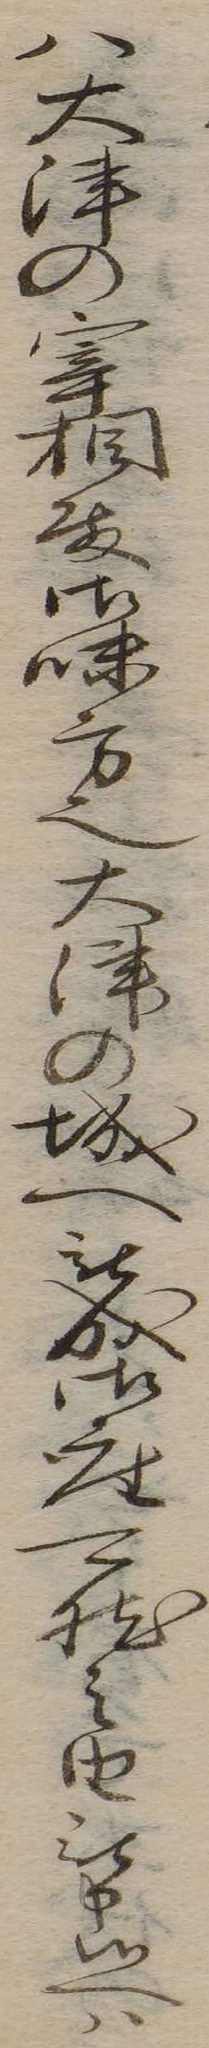は大津の宰相殿御味方也大津の城へ被成御座可然之由被申候へは

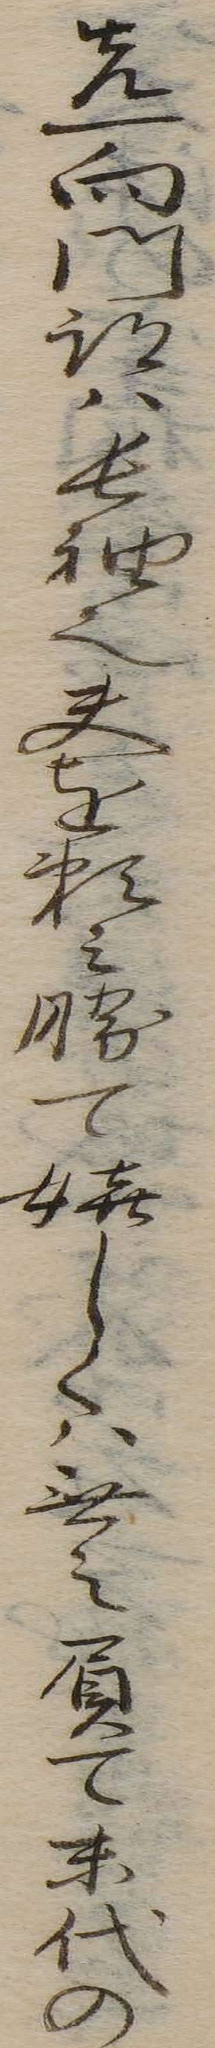先一向門跡は長袖也夫を頼み勝て嬉しくは無之負て末代の
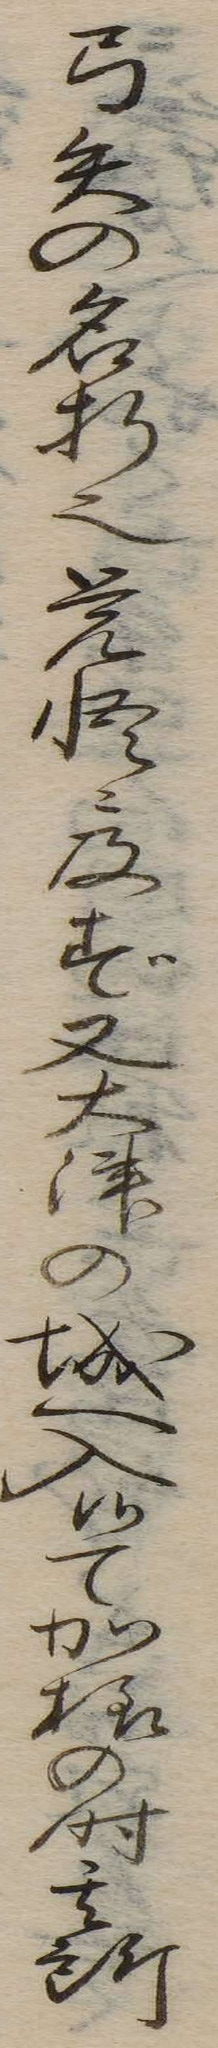弓矢の名折也覚悟ニ及ず又大津の城へ入候てか様の時其所
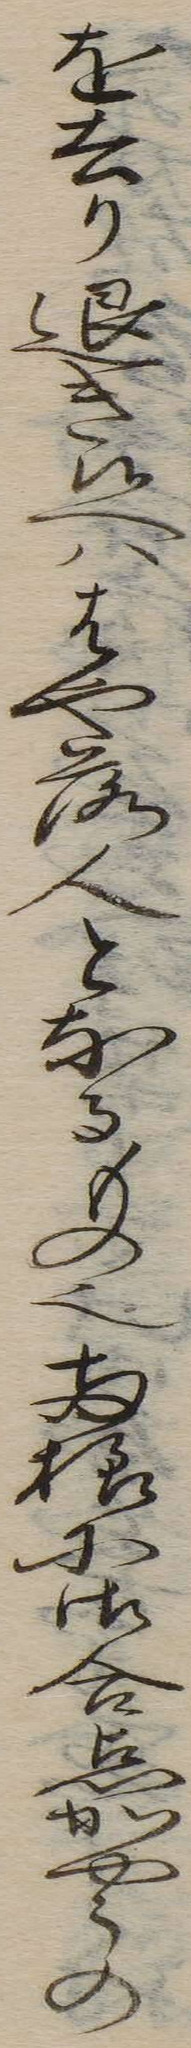を去り退き候へははや落人となるもの也両様に御合点かやうの
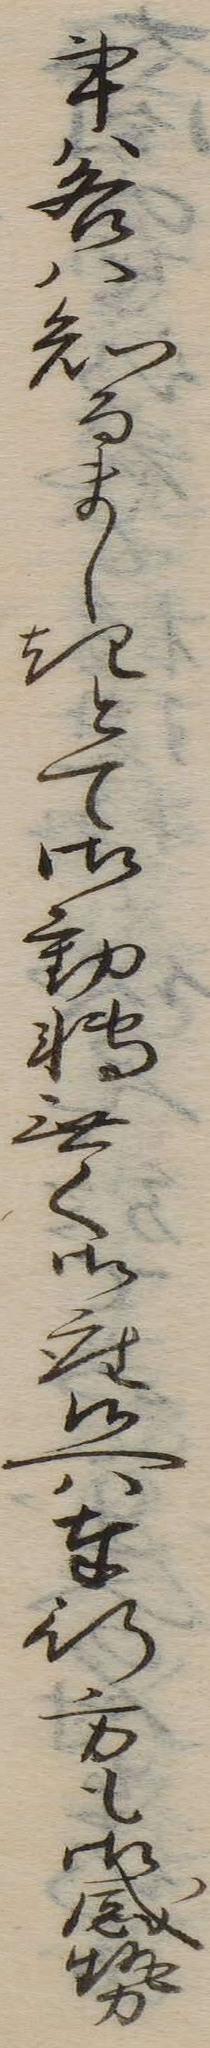事は各は知るましきとて御動転無く御座候へは奉行方も御威勢
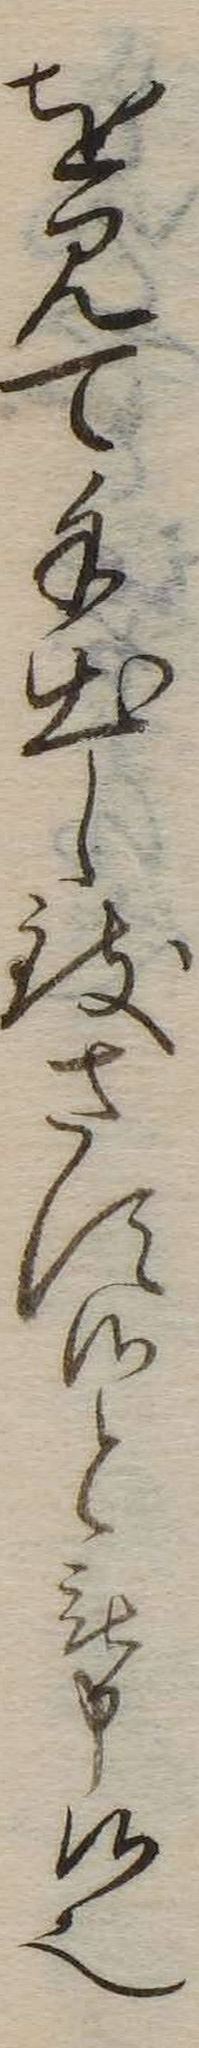を見て手出し致さす候と被申候也
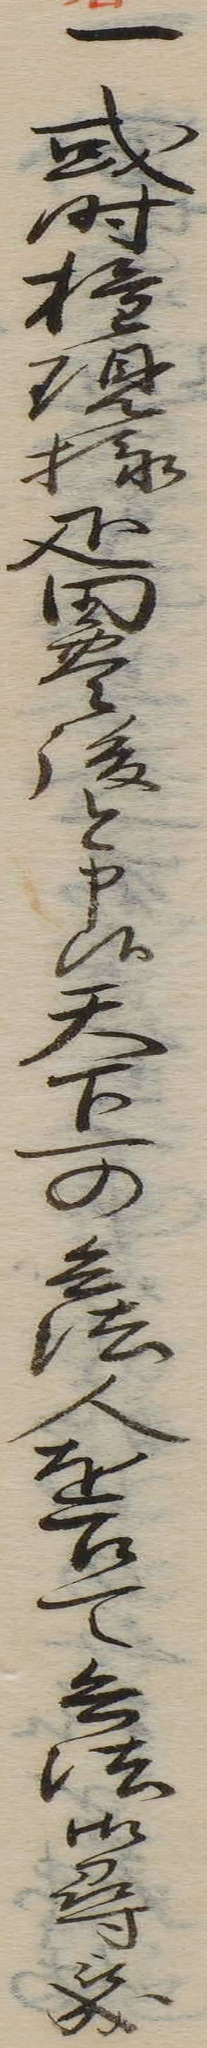一或時権現様疋田豊後と申候天下一の兵法人を召て兵法御尋被成
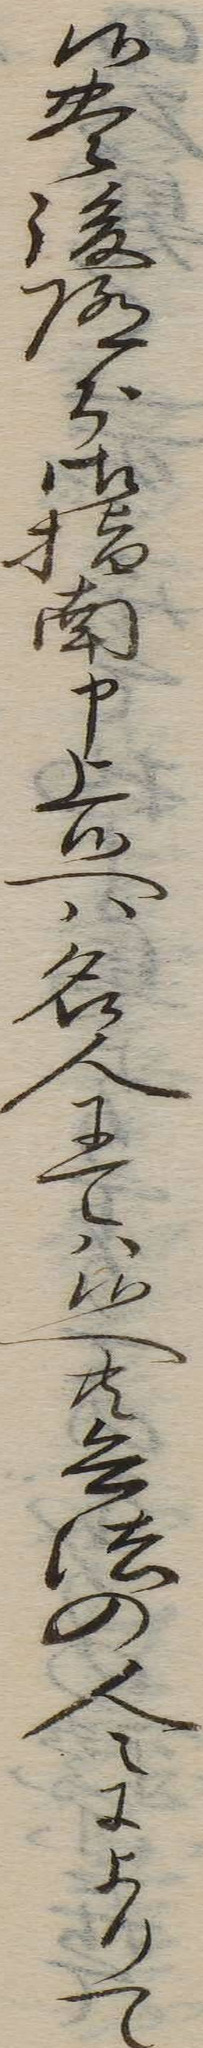候豊後随分御指南申上候へは名人にては候へ共兵法の人々によりて
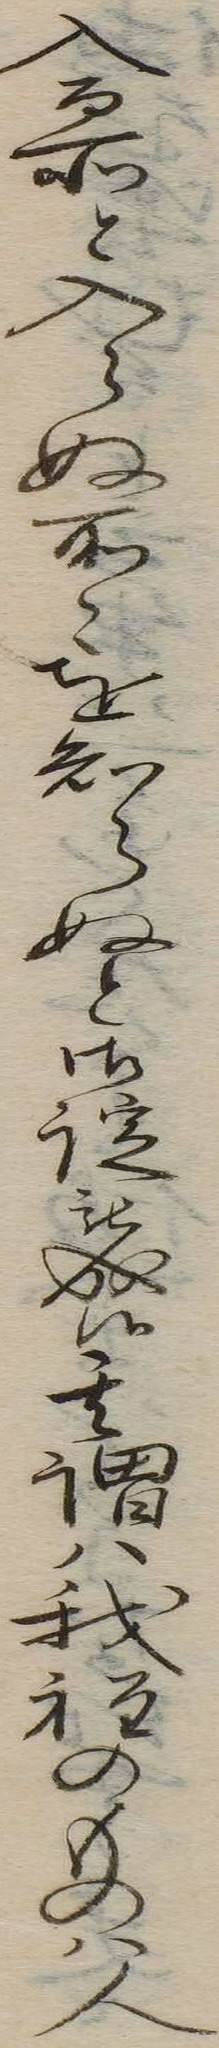入る所と入らぬ所とを知らぬと御諚被成候其謂は我程のものは人
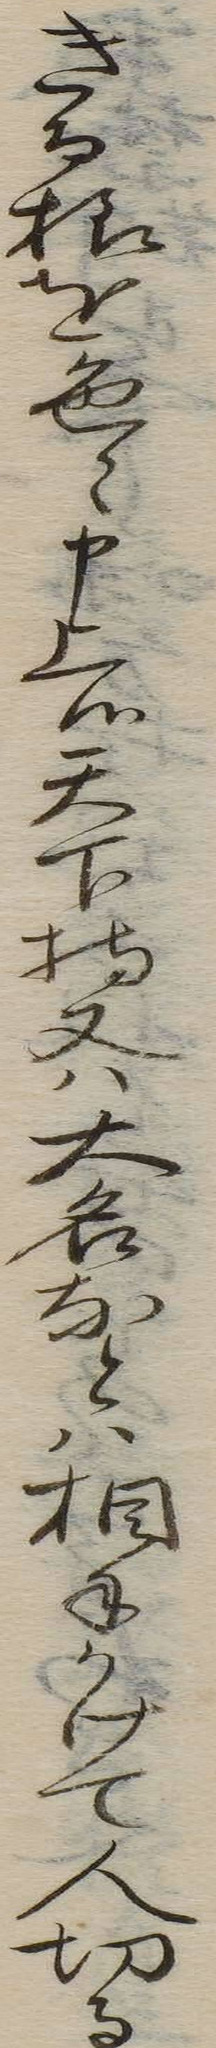きる様を色々申上候天下持又は大名なとは相手かけて人切る
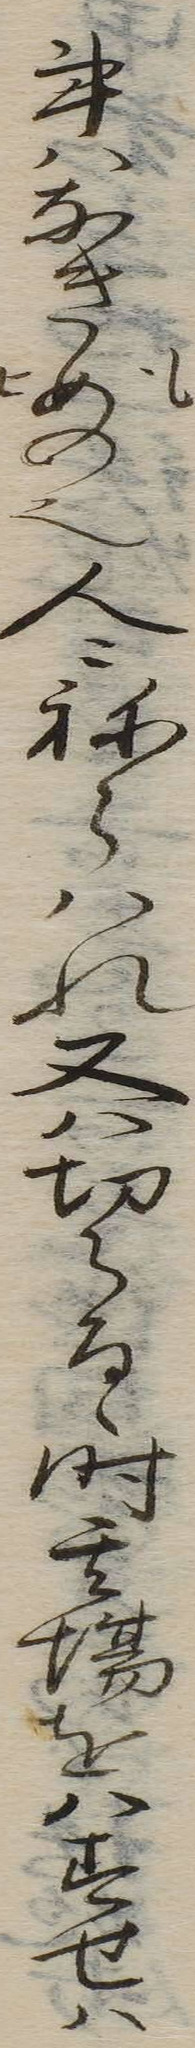事はなきめの也人ニねらはれ又は切らるゝ時其場をはすせは
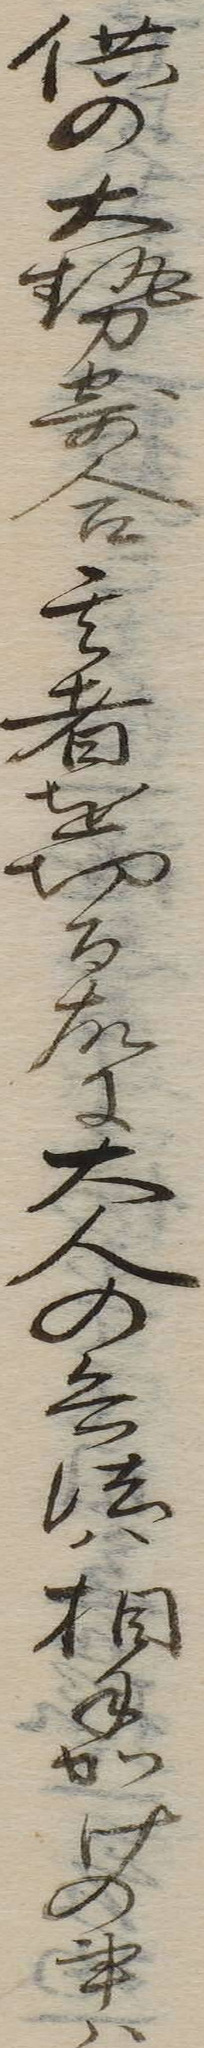供の大勢寄合其者を切る故に大人の兵法は相手かけの事ハ
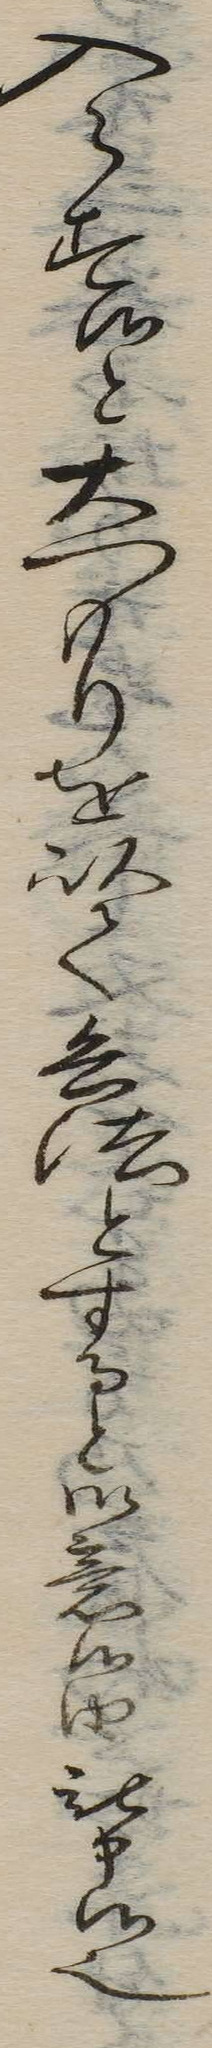入らす候と大つもりを以て兵法とすると御意候由被申候也
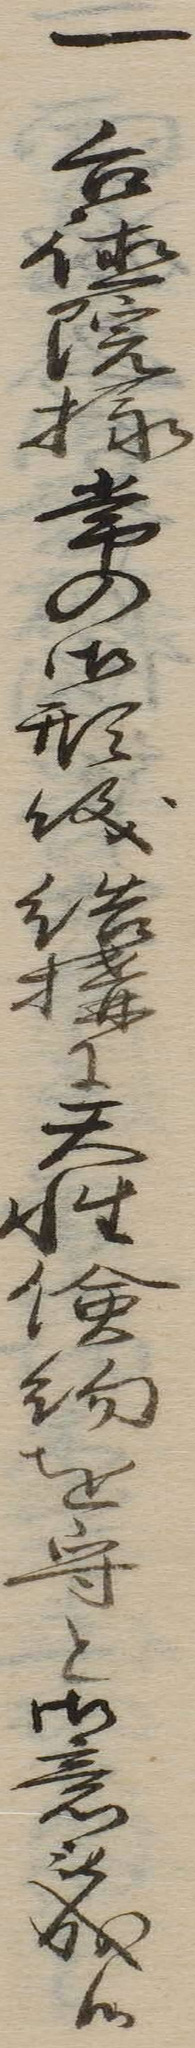一台徳院様常の御形儀結構に天性倹約を守と御意被成候
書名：三河之物語
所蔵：国文学研究資料館
